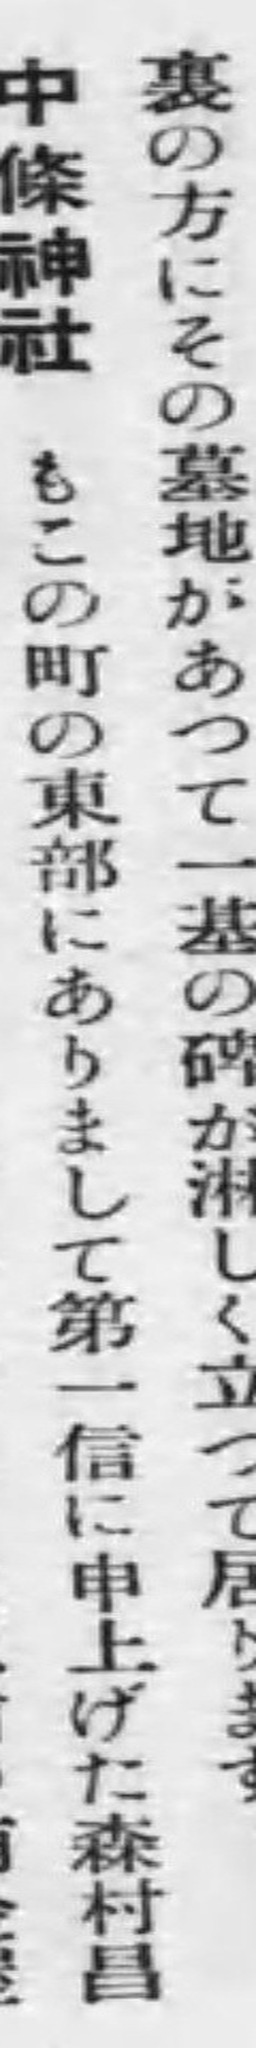中條神社もこの町の東部にありまして第一信に申上げた森村昌
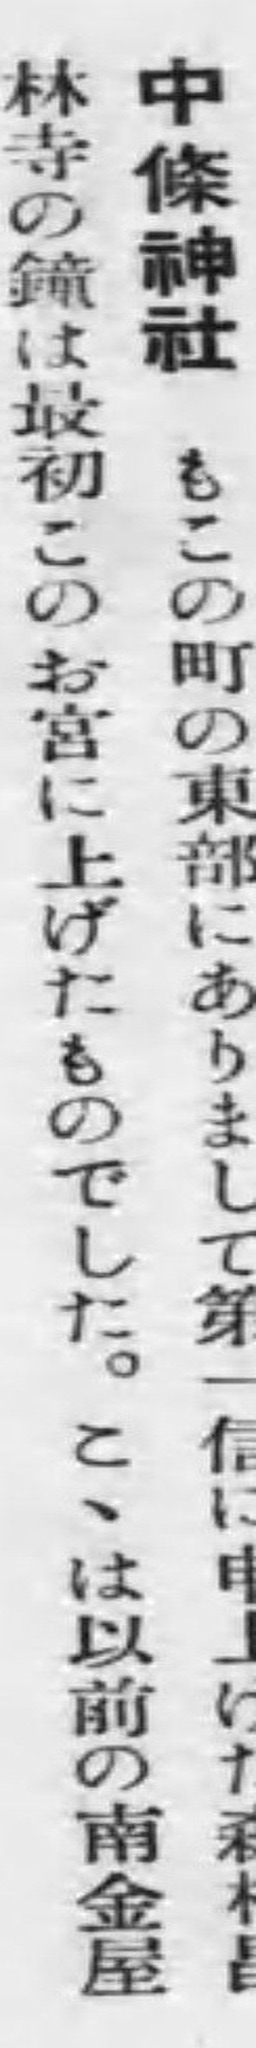林寺の鐘は最初このお宮に上げたものでした。こヽは以前の南金屋
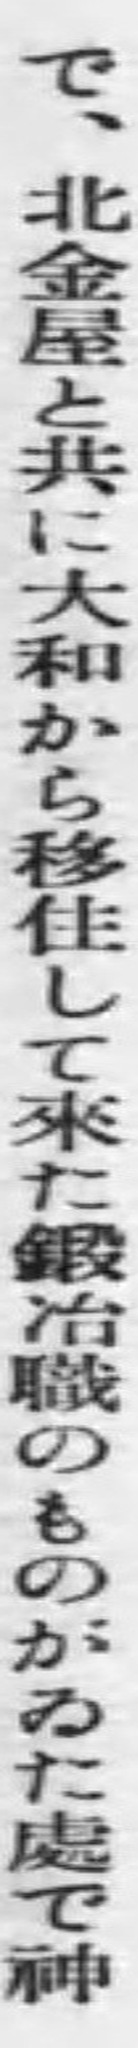で、北金屋と共に大和から移住して來た鍛冶職のものがゐた處で神
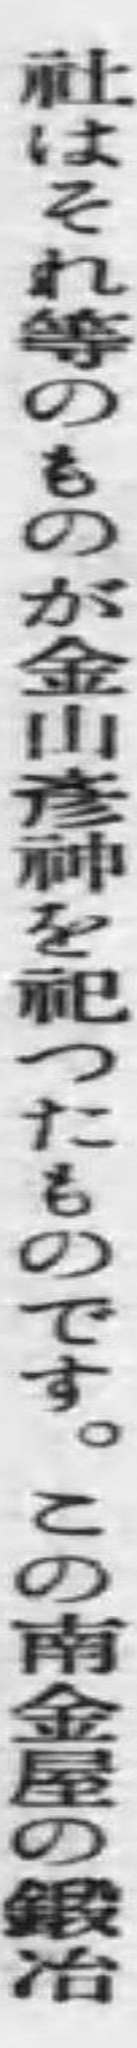社はそれ等のものが金山彦神を祀つたものです。この南金屋の鍛冶
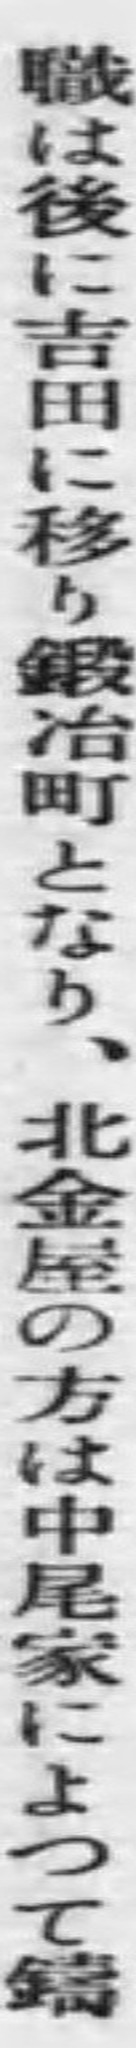職は後に吉田に移り鍛冶町となり、北金屋の方は中尾家によつて鑄
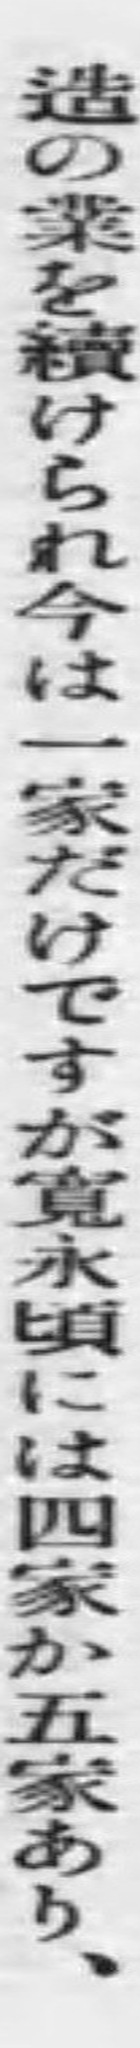造の業を續けられ今は一家だけですが寛永頃には四家か五家あり、
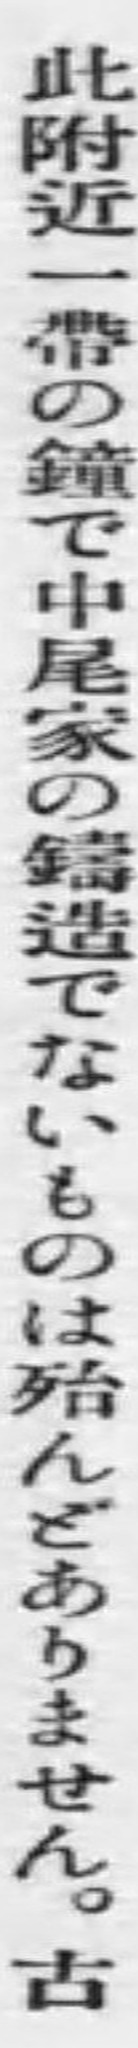此附近一帶の鐘で中尾家の鑄造でないものは殆んどありません。古
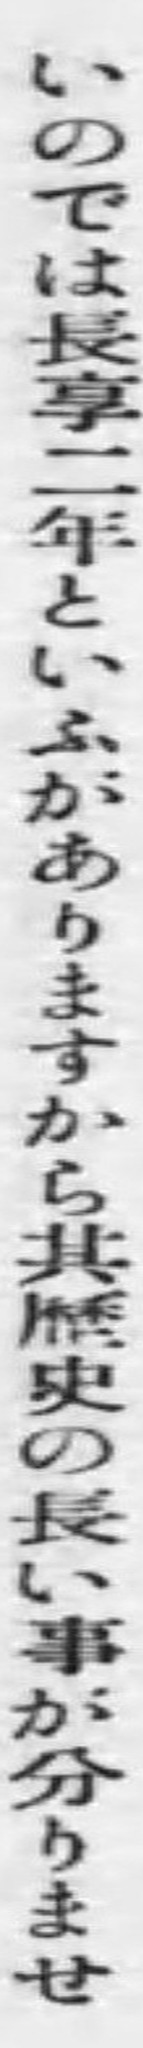いのでは長享二年といふがありますから其歴史の長い事が分りませ
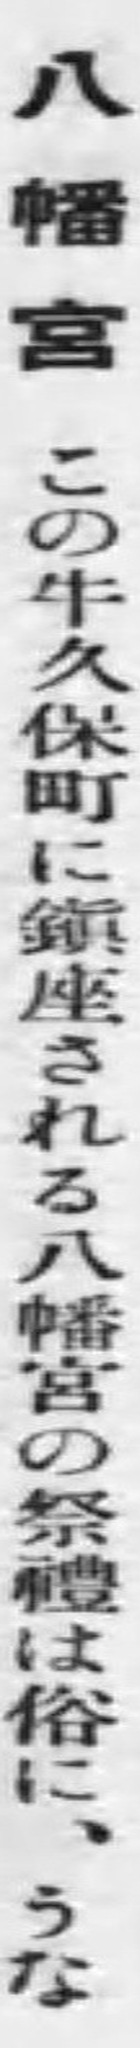八幡宮この牛久保町に鎭座される八幡宮の祭禮は俗に、うな
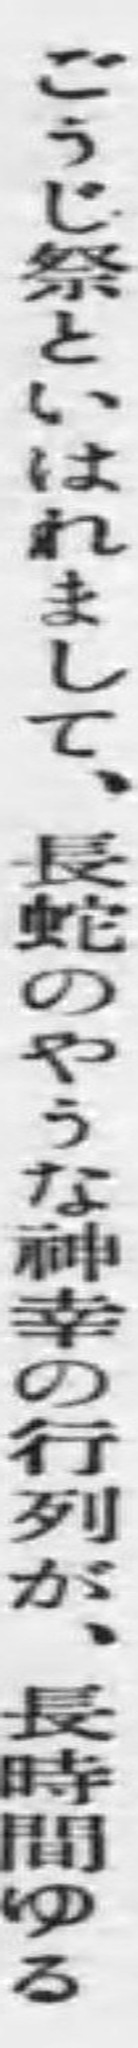ごうじ祭といはれまして、長蛇のやうな神幸の行列が、長時間ゆる
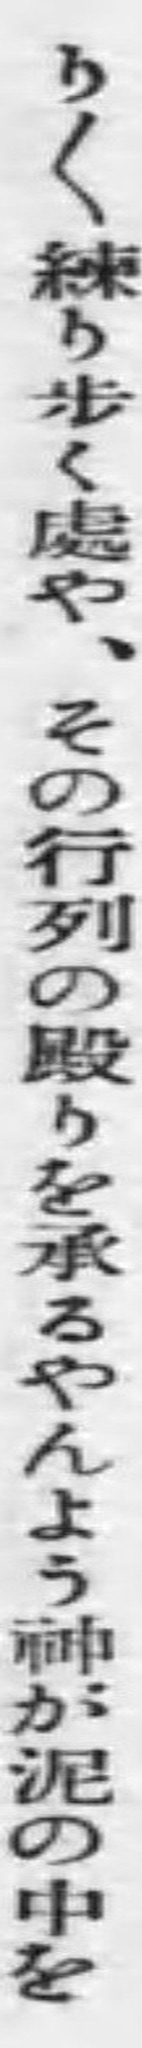り〳〵練り歩く處や、その行列の殿りを承るやんよう神が泥の中を
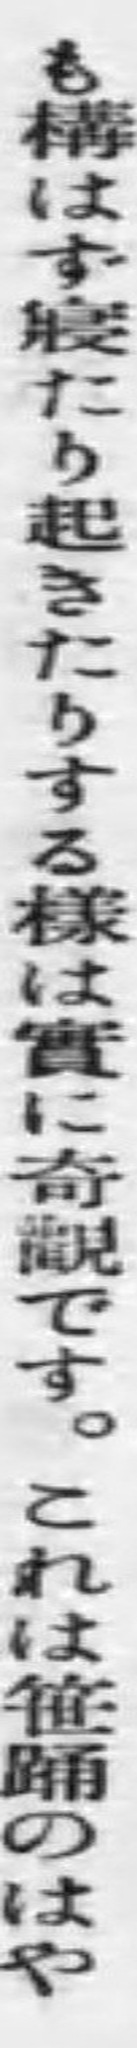も構はず寢たり起きたりする樣は實に奇觀です。これは笹踊のはや
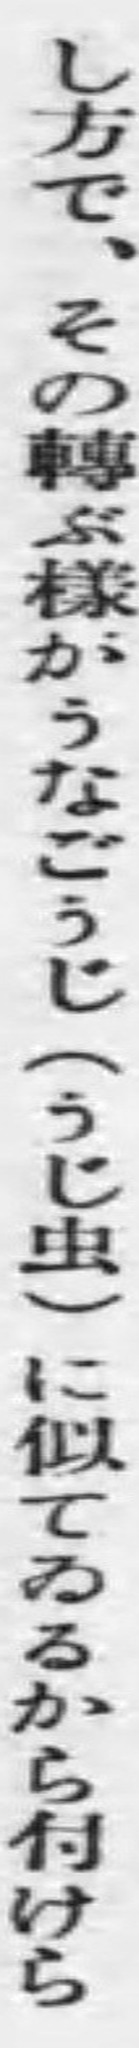し方で、その轉ぶ樣がうなごうじ(うじ虫)に似てゐるから付けら

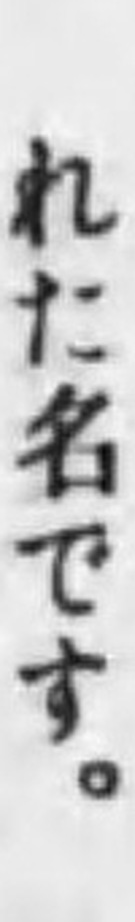れた名です。
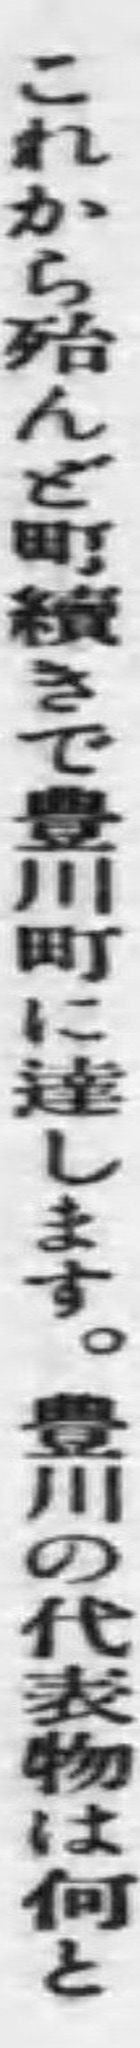これから殆んど町續きで豊川町に達します。豊川の代表物は何と
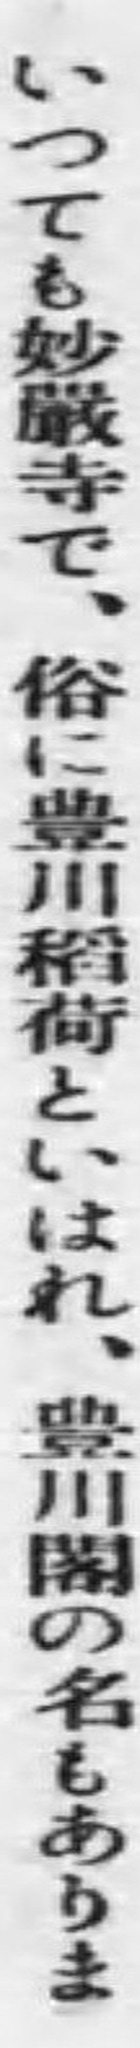いつても妙嚴寺で、俗に豊川稻荷といはれ、豊川閣の名もありま
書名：東三河道中記 : 豊橋市及其附近案内
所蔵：国立国会図書館 National Diet Library, JAPAN
